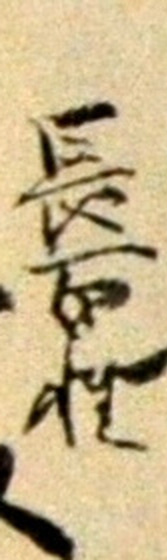長百性
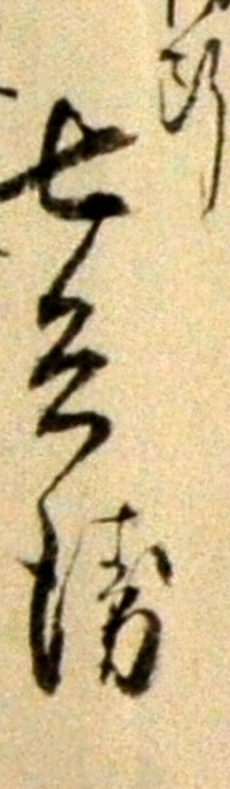喜兵衛
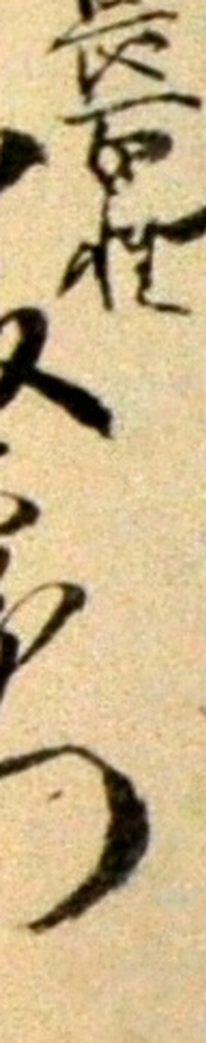藤右衛門

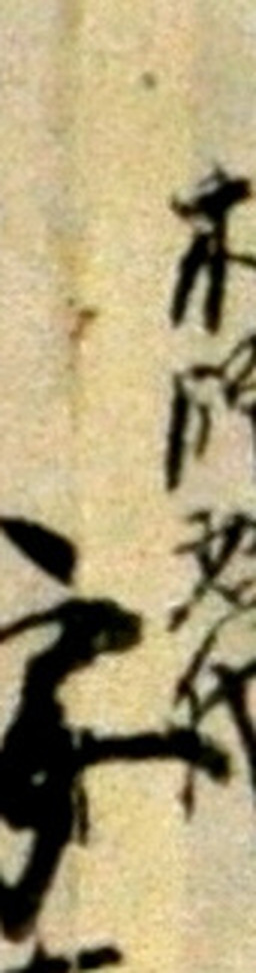木師惣代
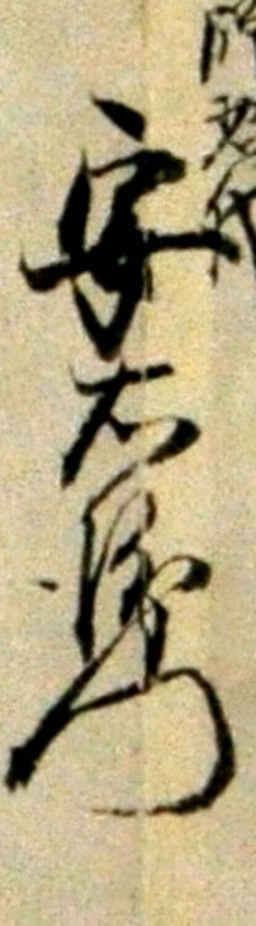藤右衛門
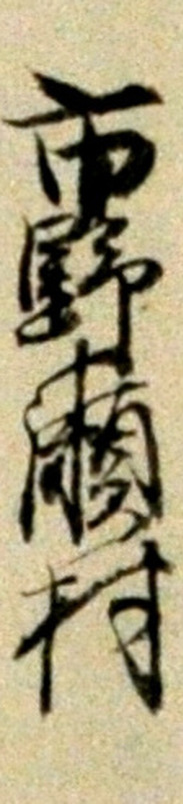市野瀬村
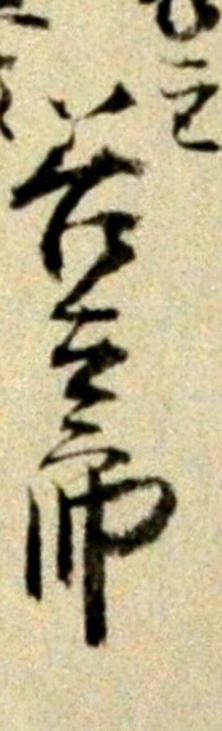善太郎
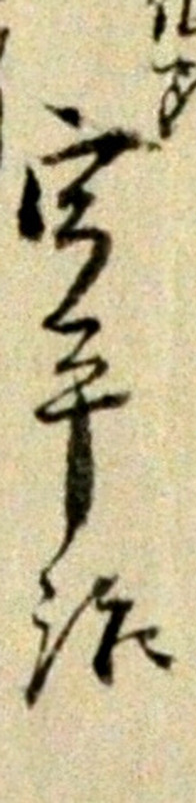宇平治
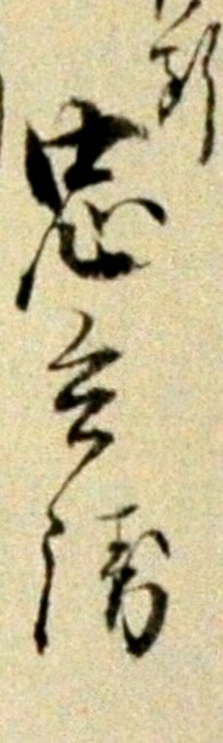忠兵衛
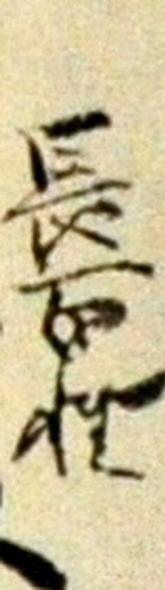長百性
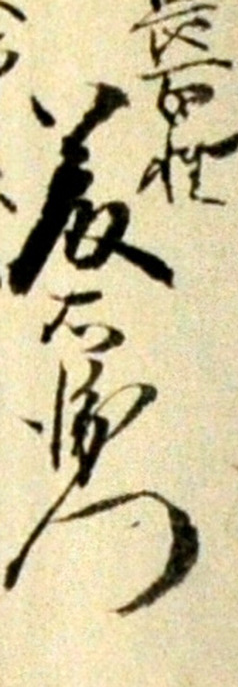藤右衛門
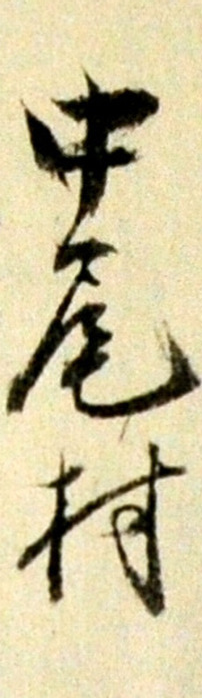中尾村
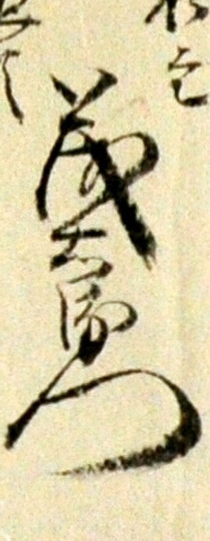茂右衛門
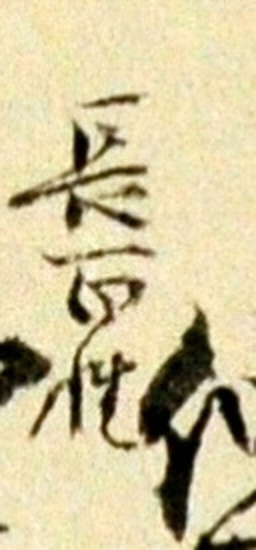長百性
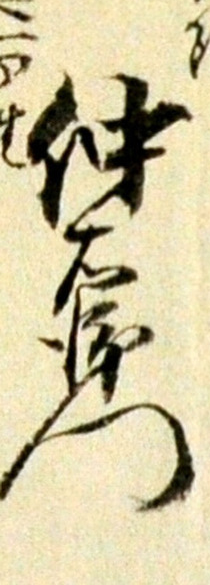仲右衛門
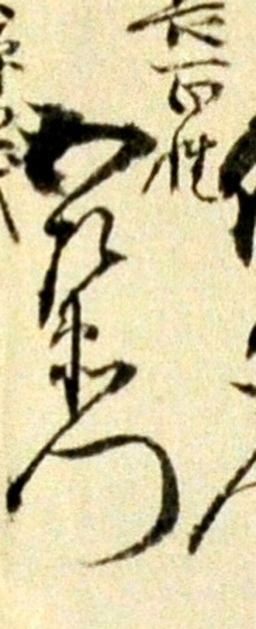五左衛門
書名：木師郷御定書（写）
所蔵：伊那市立高遠町図書館・合同会社AMANE
